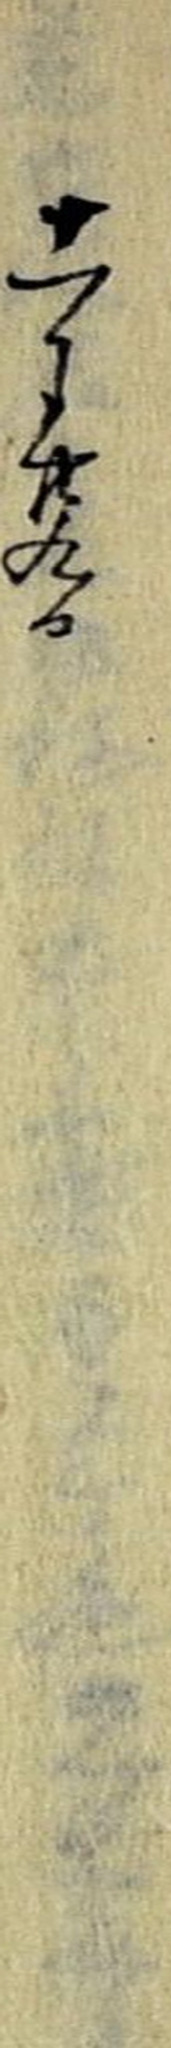十一月廿九日
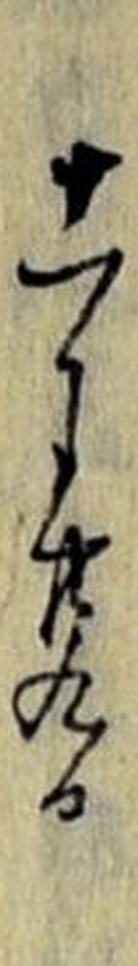十一月廿九日
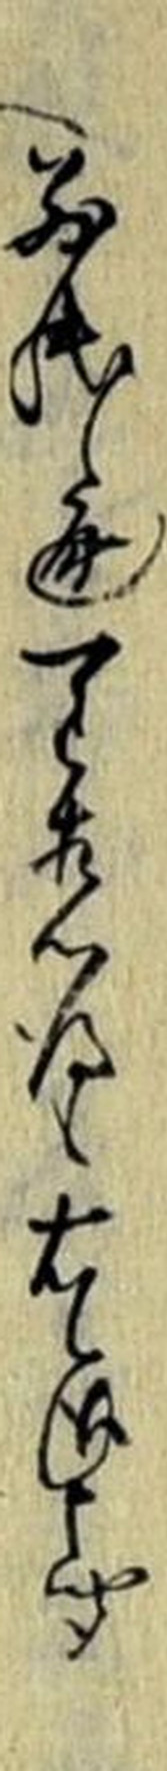別紙之通可被相心得右之趣申聞御用人
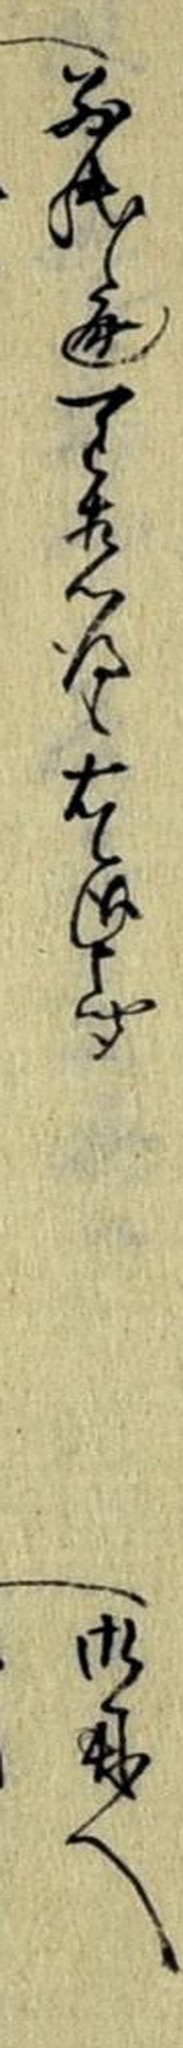別紙之通可被相心得右之趣申聞御用人
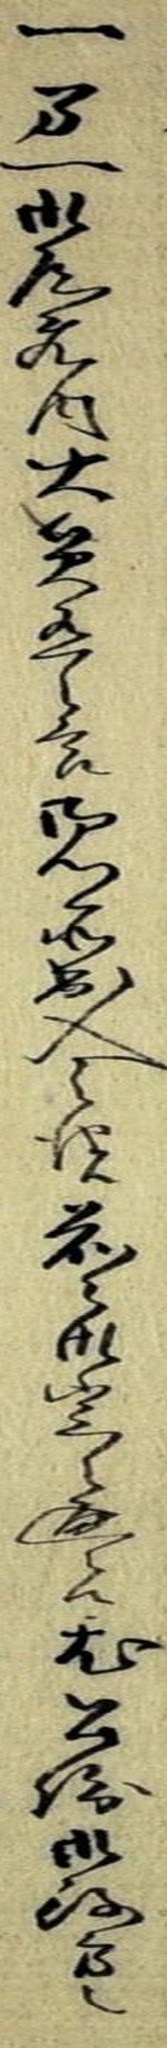一万一御屋敷内大災有之候節御門所出入之儀前々御定之通に候尤公儀御役方之
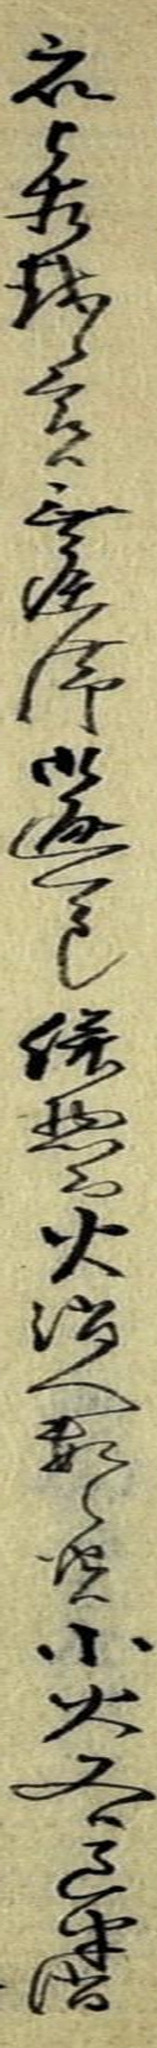衆被相越候節は無遅滞御通可被申候併惣而火消人数之儀は小火又は過半消
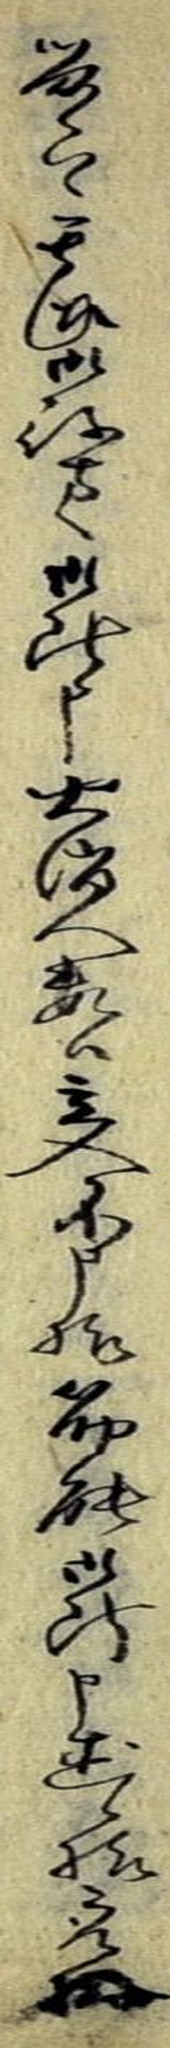留候はヽ其趣御役方へ御断申火消人数は立入不申様筋能御断申述候様取扱
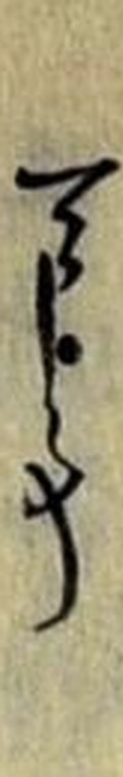可申事
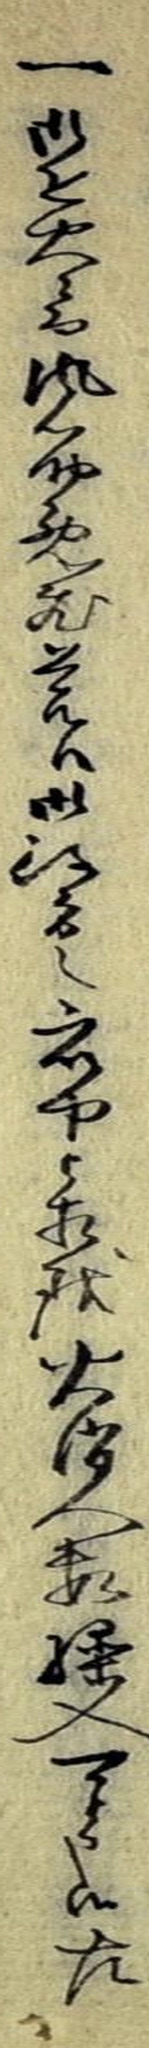一御近火に而風筋悪敷節は御役方之衆中被相越火消人数繰入可申候左
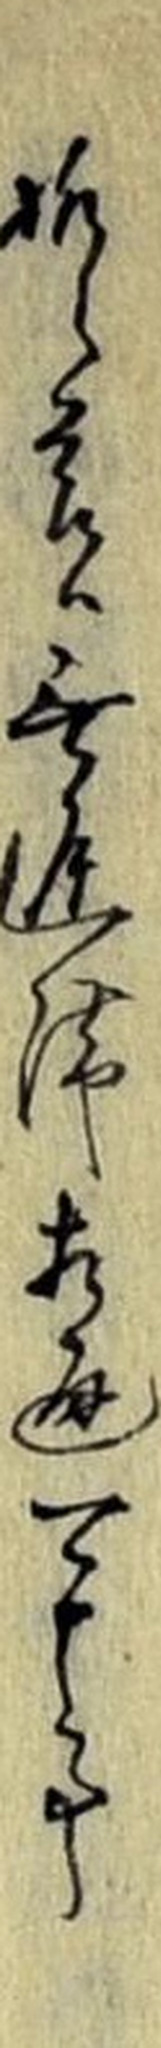様之節は無遅滞相通可申事
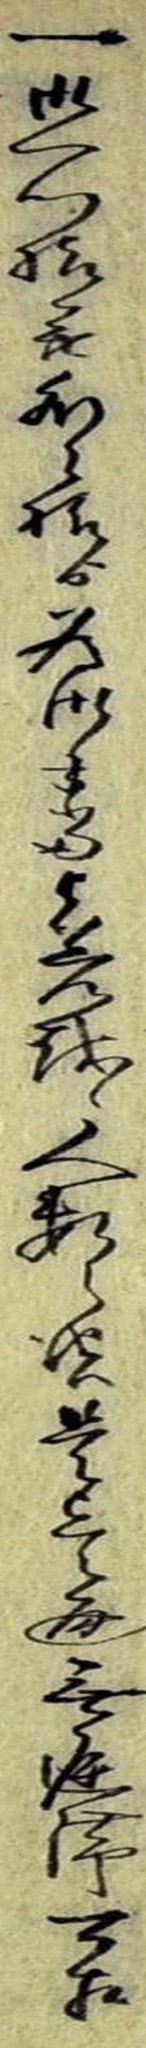一御一門様并外々様ゟ為御手当被差越候人数之儀は是迄之通無遅滞可相
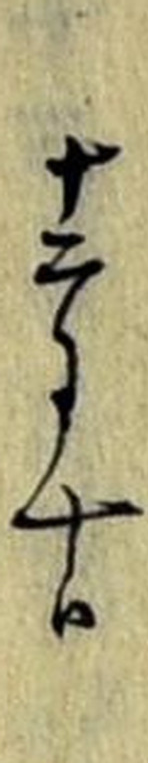十二月十日

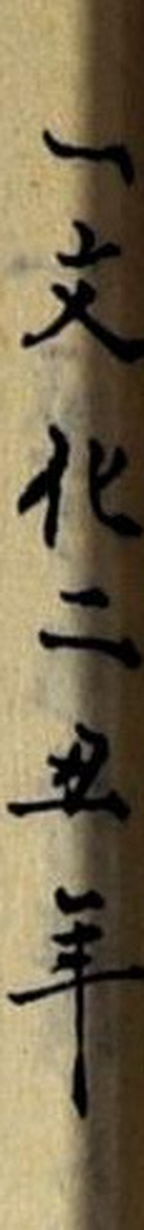一文化二丑年
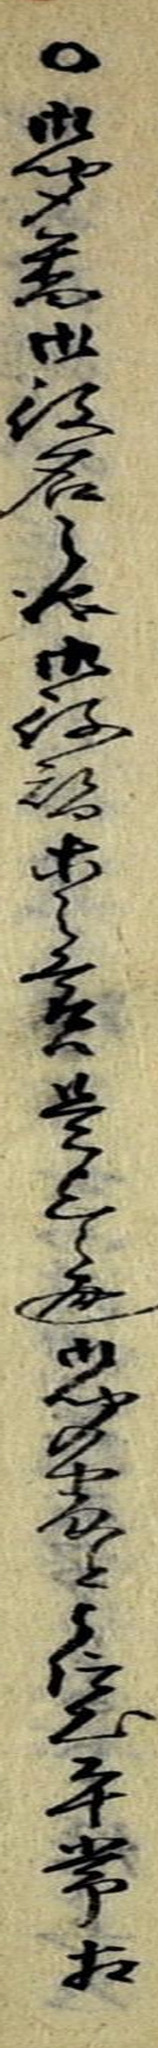○御聞番御役名之儀御役替等之節は是迄之通御聞番と被仰出平常相
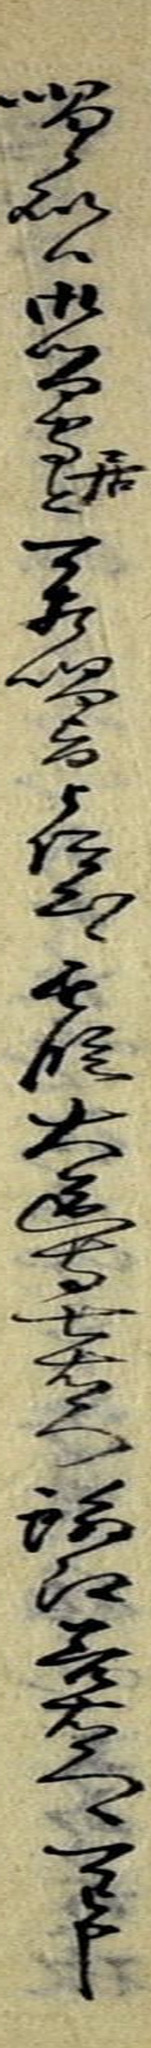唱候処は御留守居と可相唱旨被仰出候其段大道寺七右衛門蟹江善右衛門へ可被申
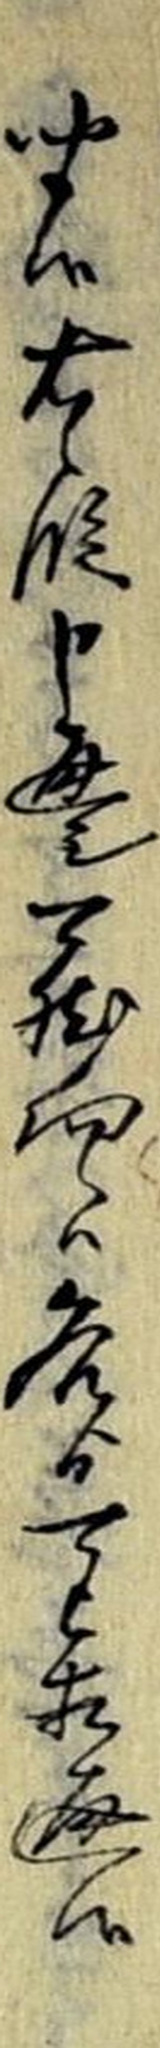聞候右之段申通し可然向へは各ゟ可被相通候
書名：命令之部 四
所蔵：福井県文書館 Fukui Prefectural Archives
